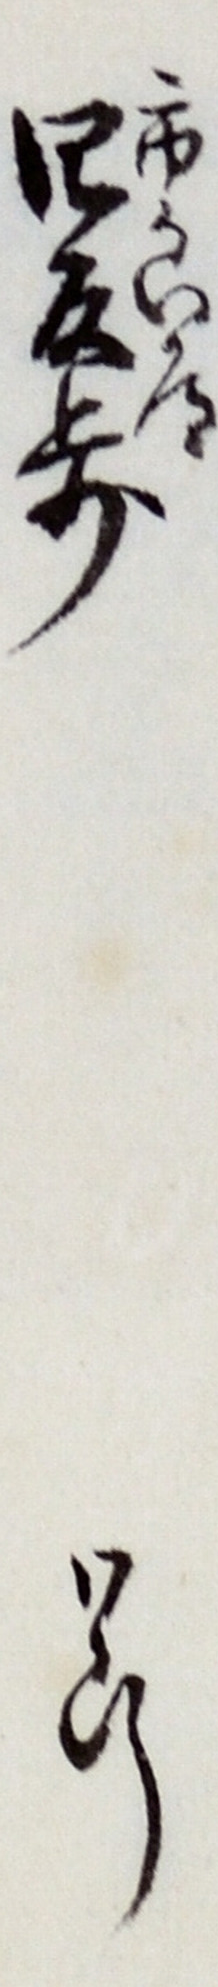四反歩同断
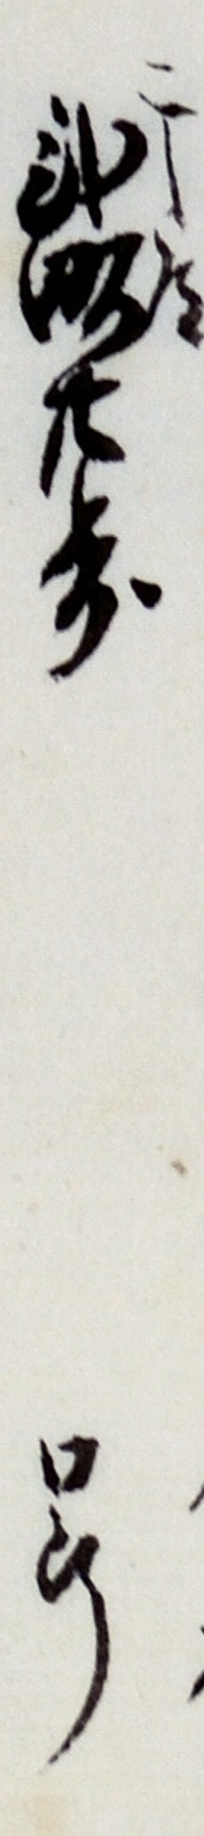弐畝廿歩同断
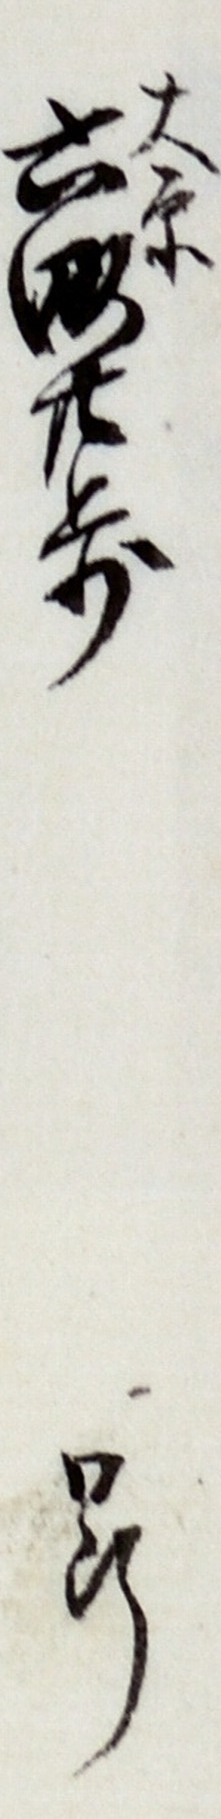六畝廿歩同断
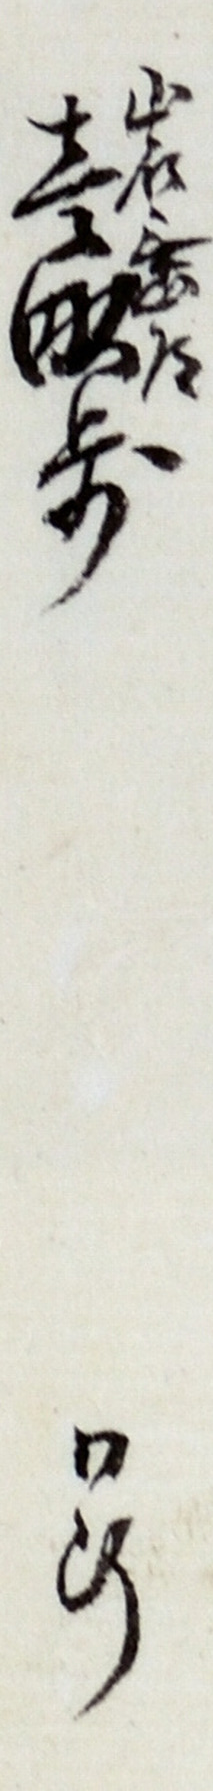壱畝歩同断
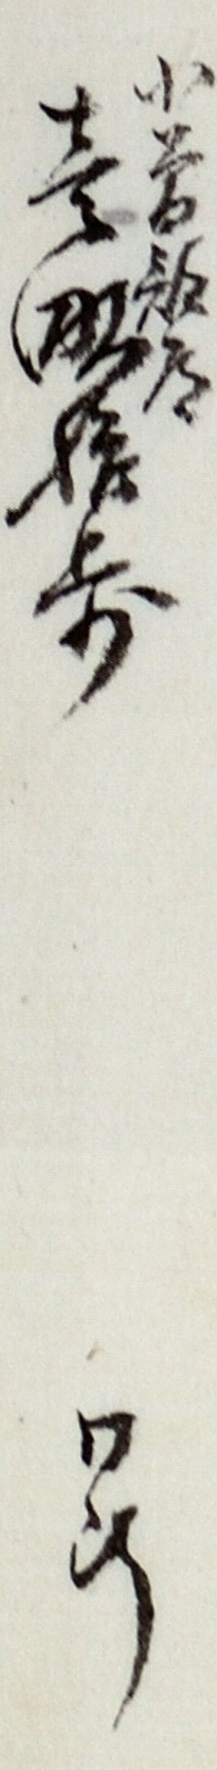壱畝拾歩同断
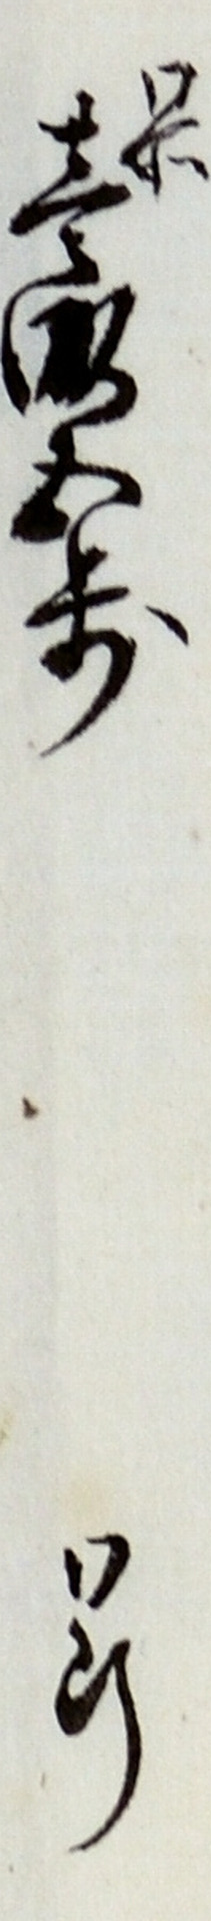壱畝五歩同断
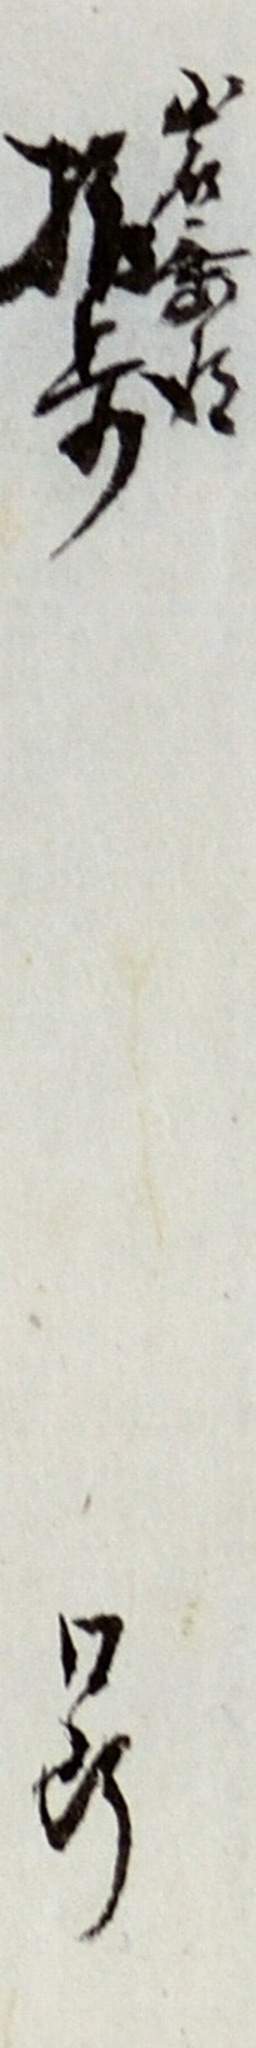拾歩同断
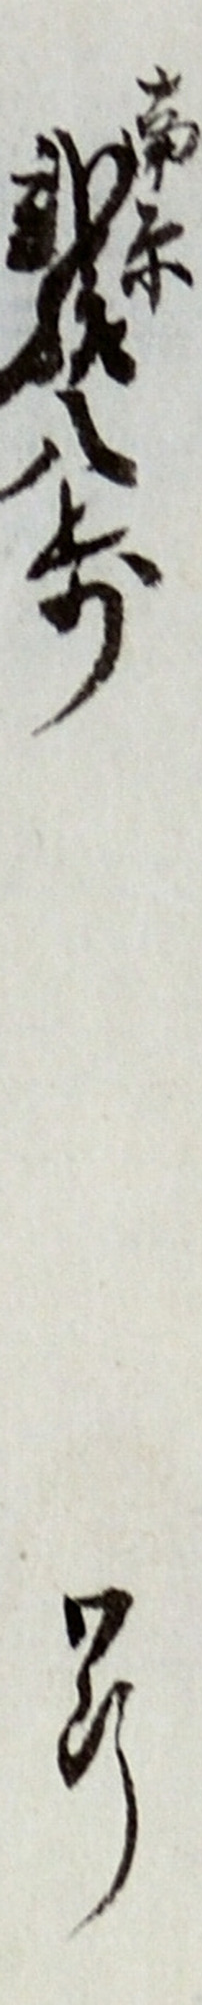弐拾八歩同断
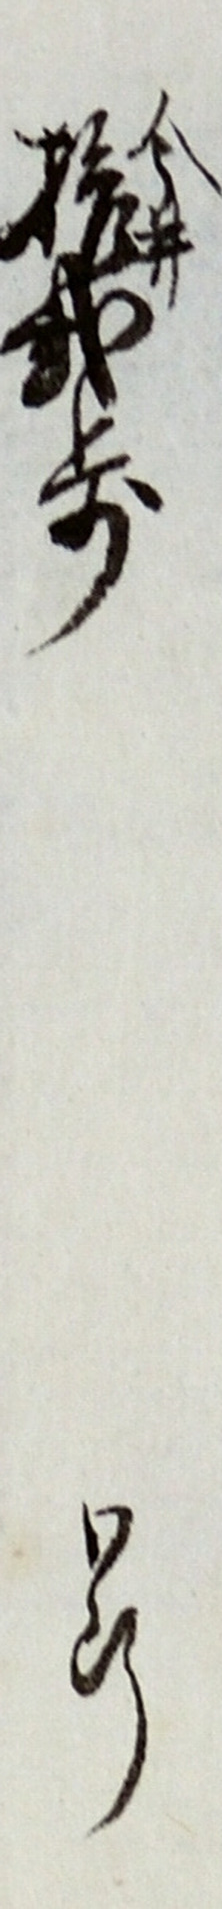拾弐歩同断
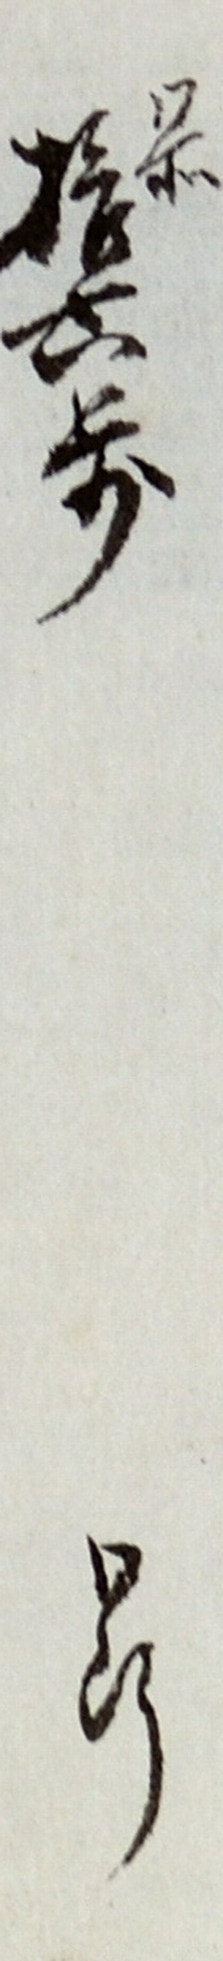拾六歩同断
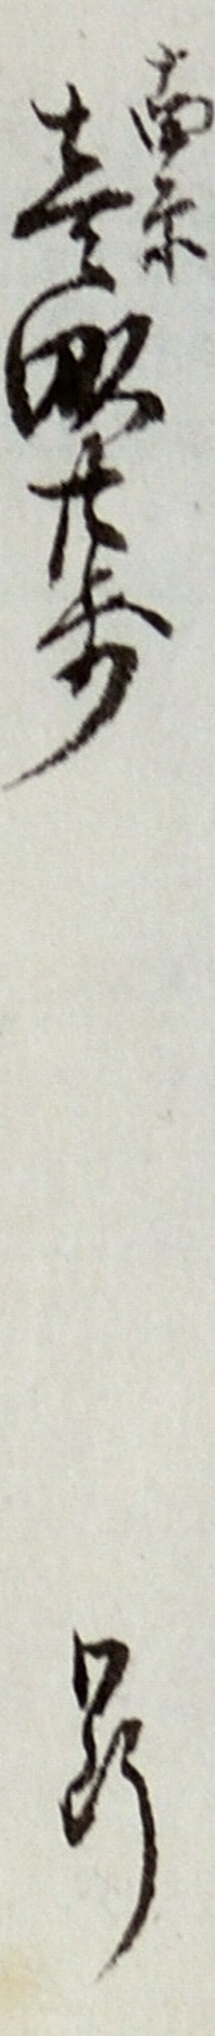壱畝廿歩同断
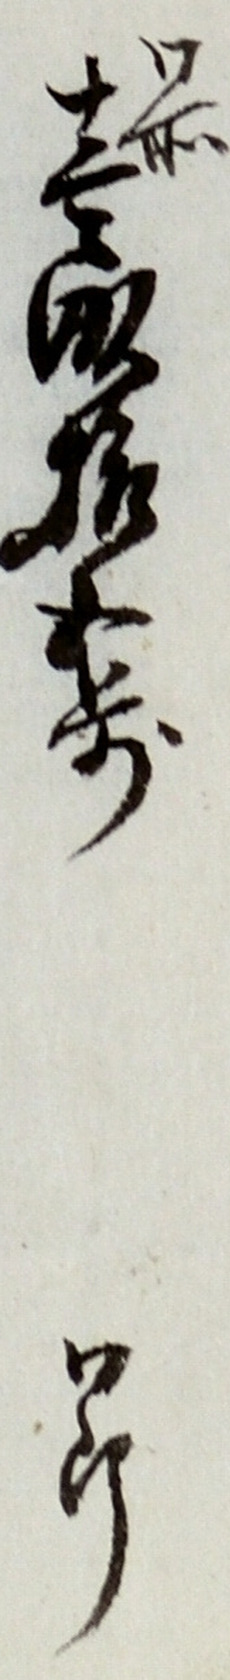壱畝拾五歩同断

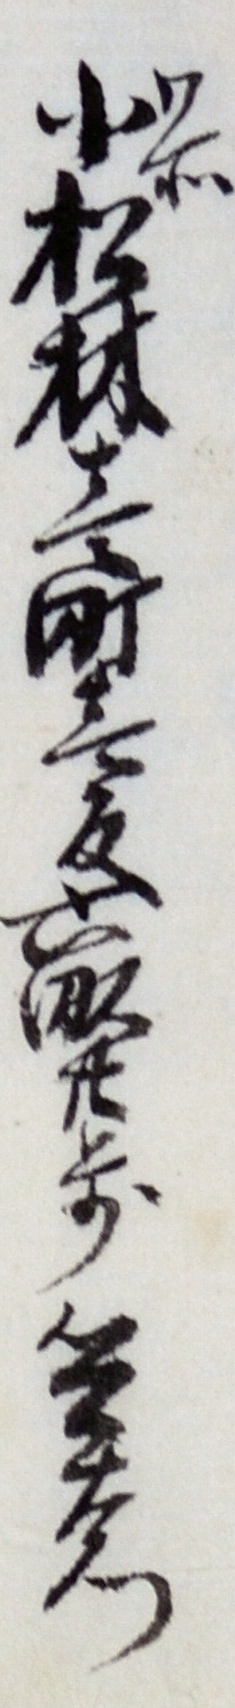小松林壱町壱反六畝廿歩兵右衛門
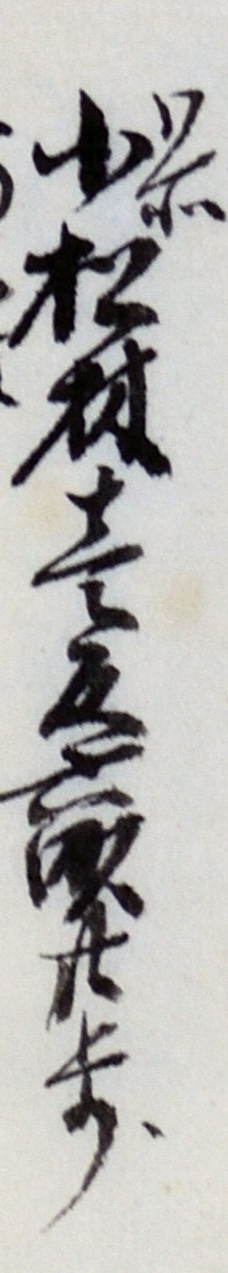小松林壱反六畝廿歩権助
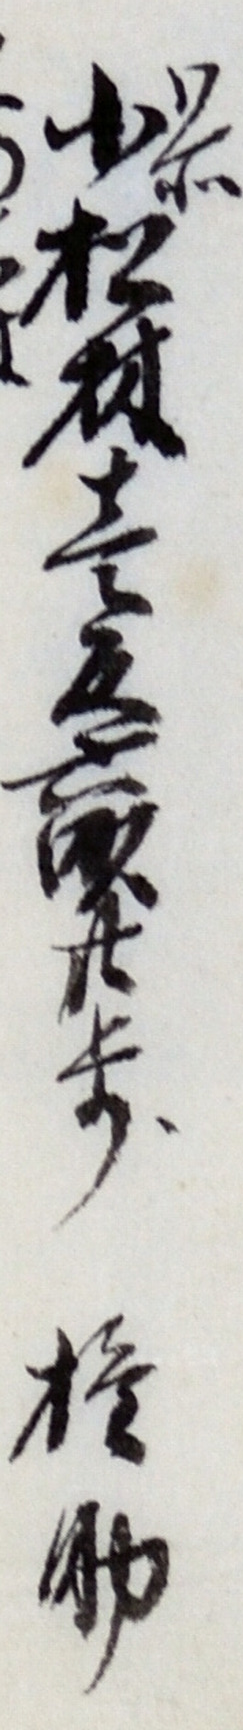小松林壱反六畝廿歩権助
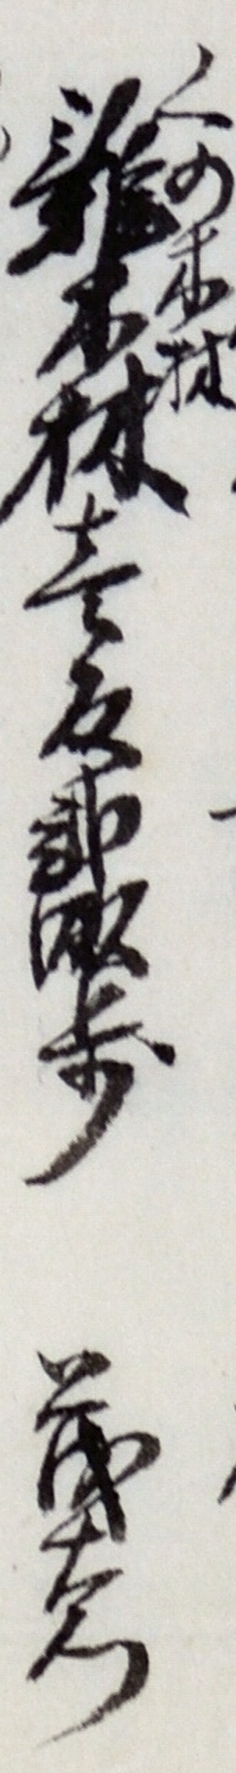雑木林壱反弐畝歩茂右衛門
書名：御領分中山林社地手控
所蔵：伊那市立高遠町図書館・合同会社AMANE
